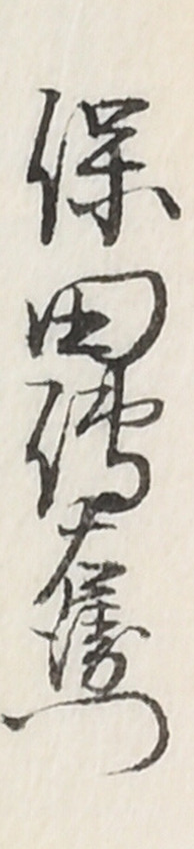保田伝右衛門
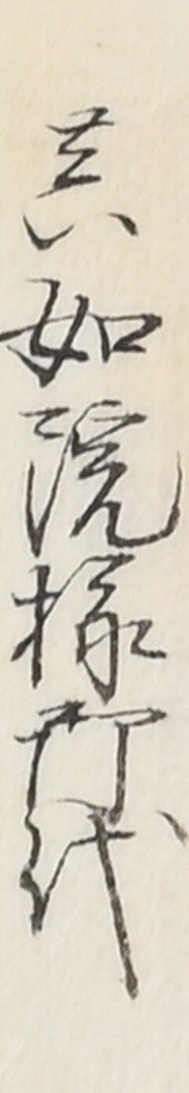真如院様御代
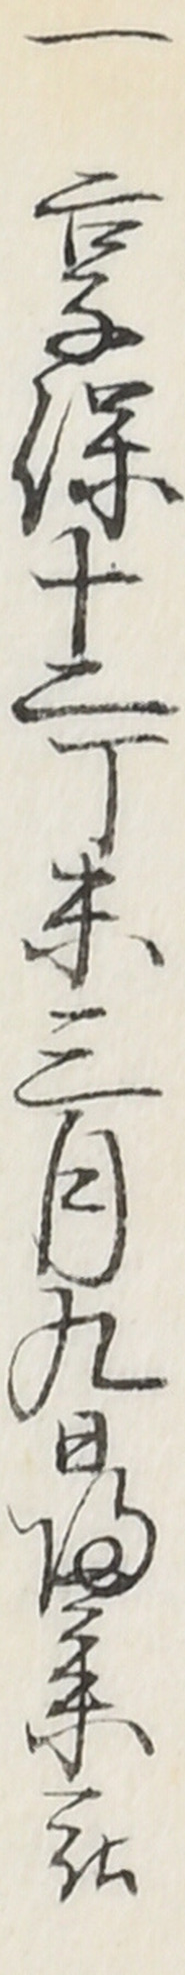一享保十二丁未三月九日帰参被
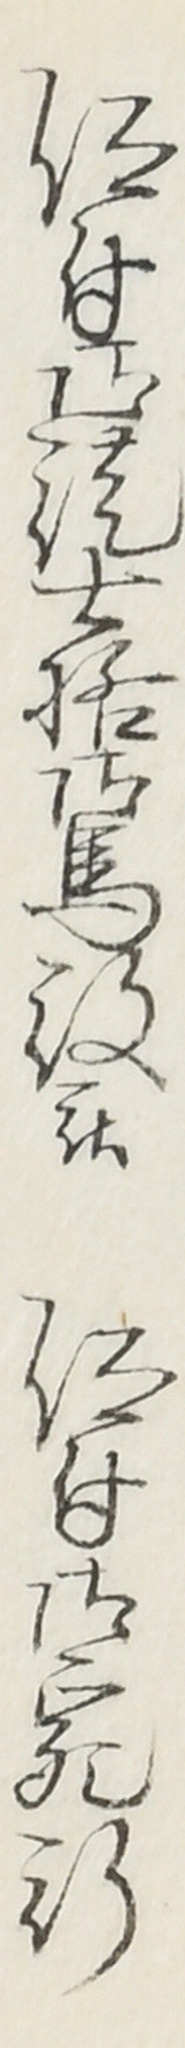仰付御徒士格御馬役被仰付御宛行
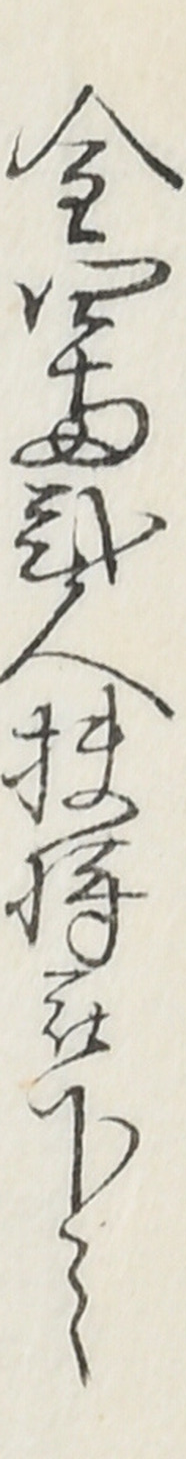金四両弐人扶持被下之
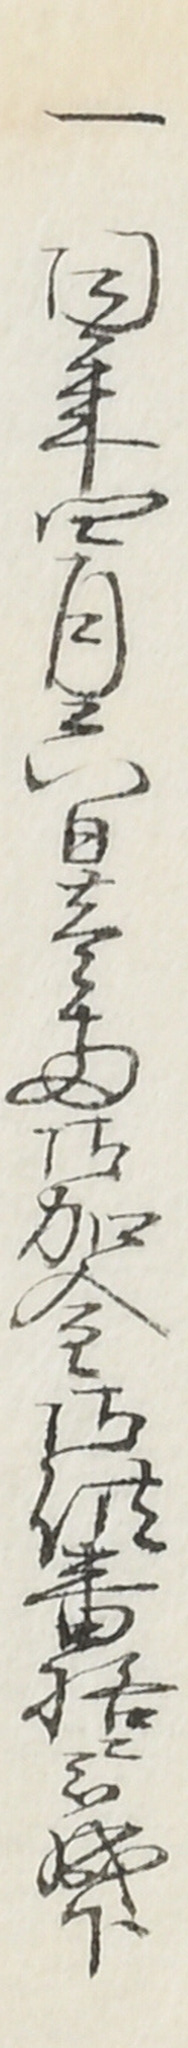一同年四月六月壱両御加金御供番格ニ被成下
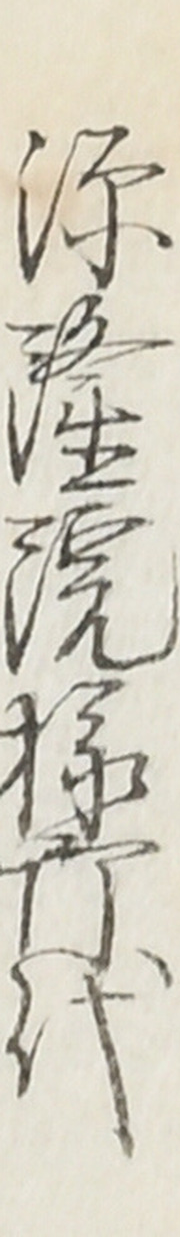源隆院様御代
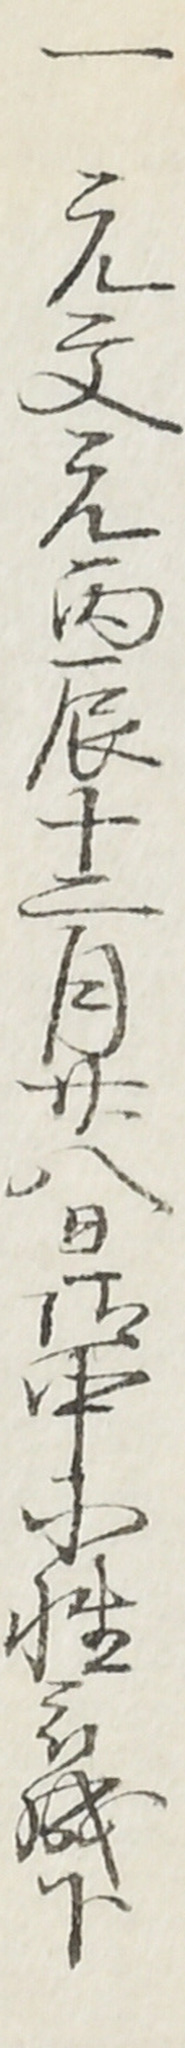一元文元丙辰十二月廿八日御中小性被成下
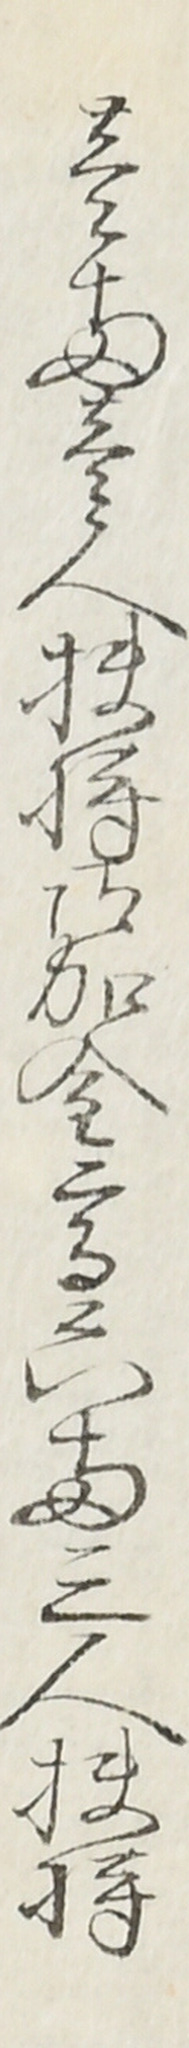壱両壱人扶持御加金高六両三人扶持
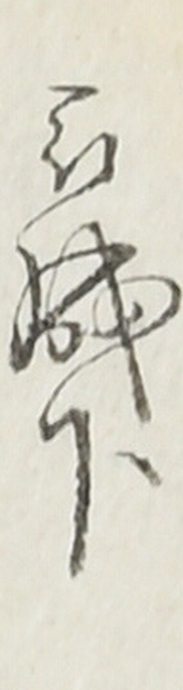被成下
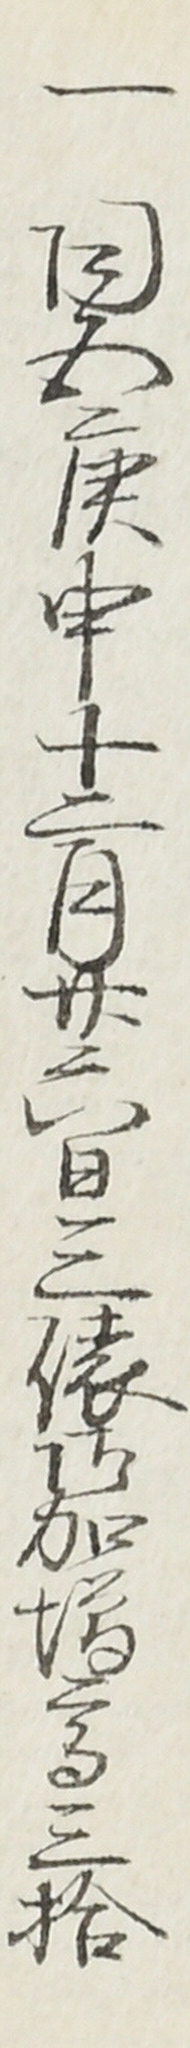一同五庚申十二月廿六日三俵御加増高三拾
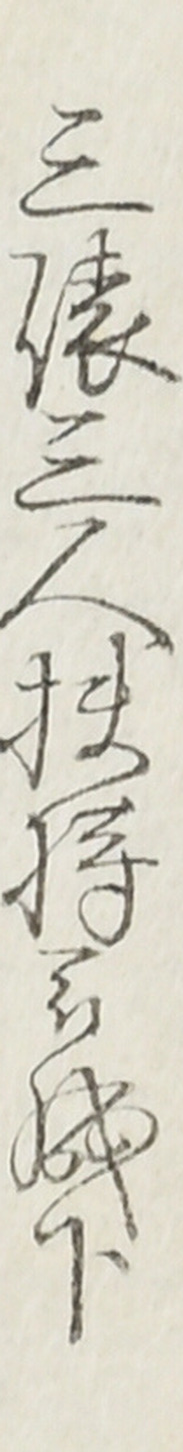三俵三人扶持被成下
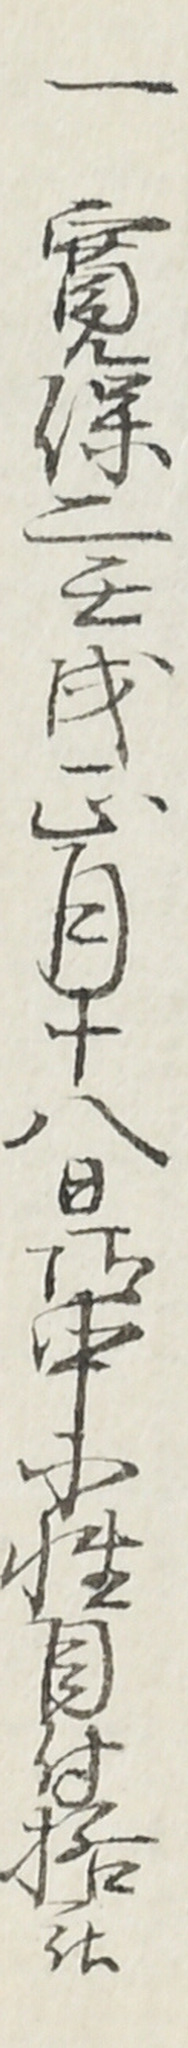一寛保二壬戌正月十八日御中小性目付格被
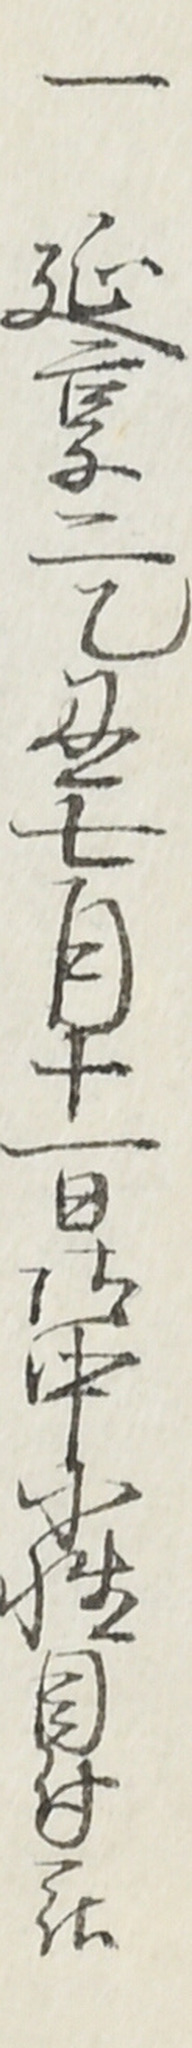一延享二乙丑七月十一日御中小性目付被
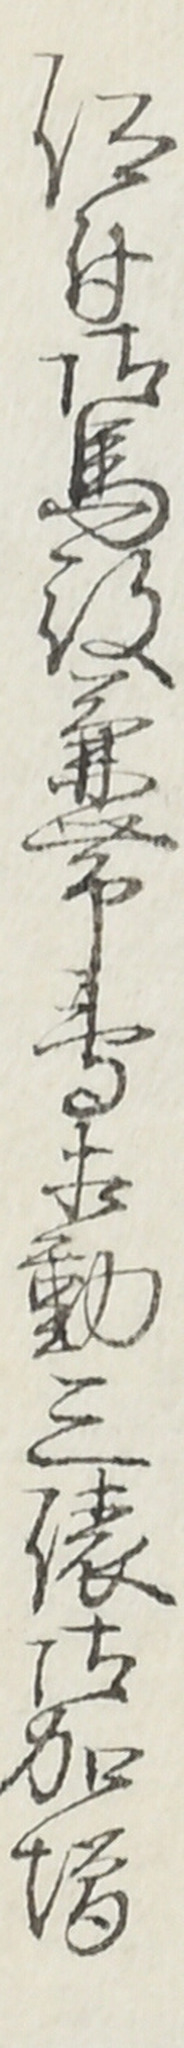仰付御馬役兼帯専相勤三俵御加増
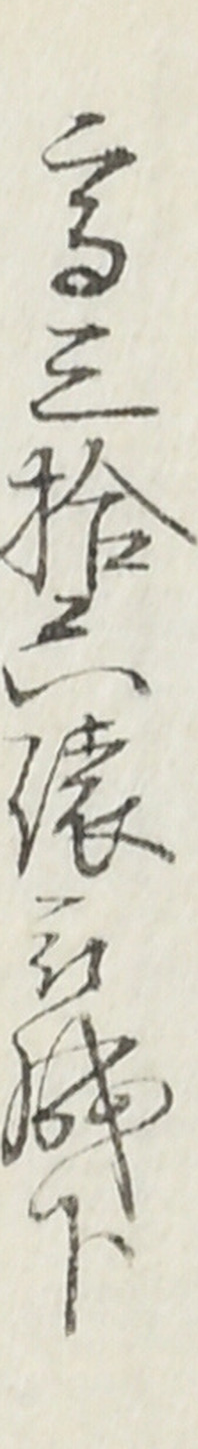高三拾六俵被成下
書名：給人諸士勤仕録（七）
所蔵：伊那市立高遠町図書館・合同会社AMANE
